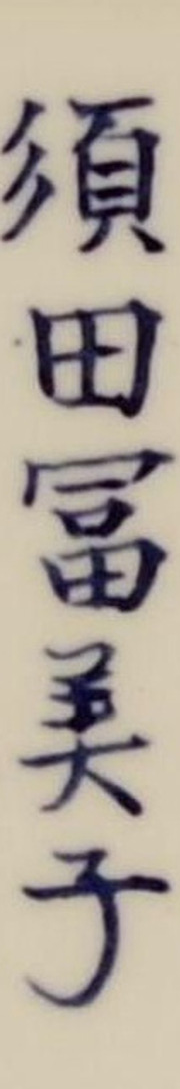須田冨美子
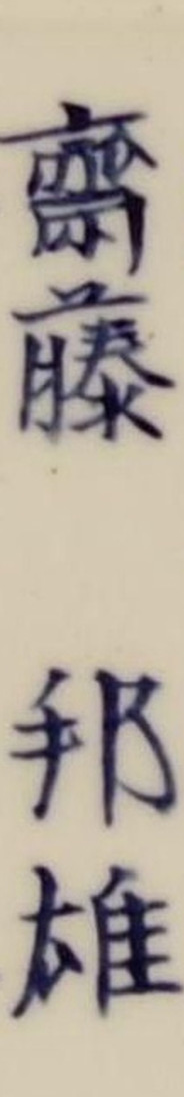斎藤邦雄
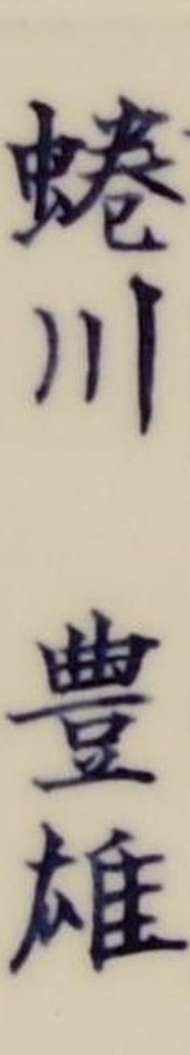蜷川豊雄
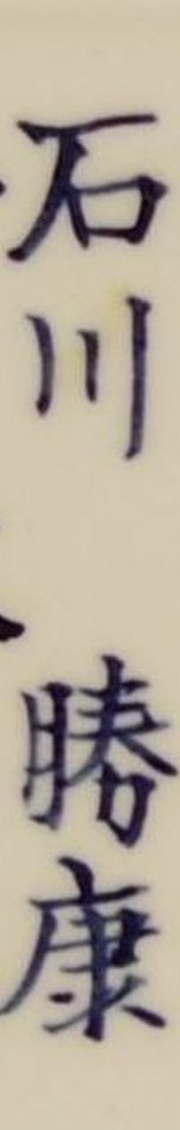石川勝康
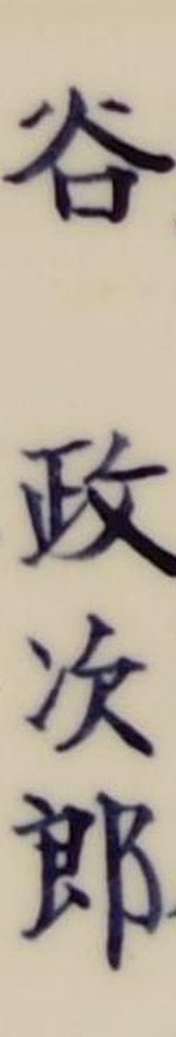谷政次郎
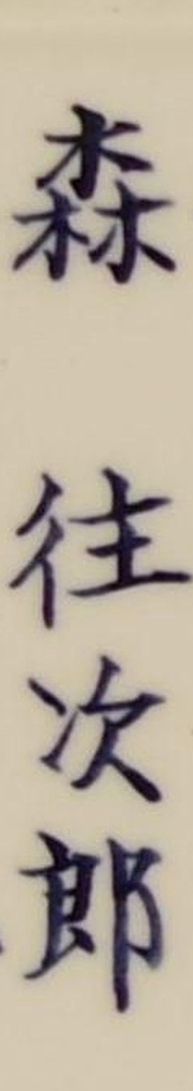森住次郎
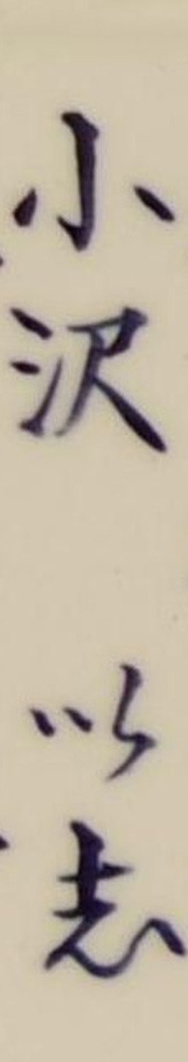小沢いし
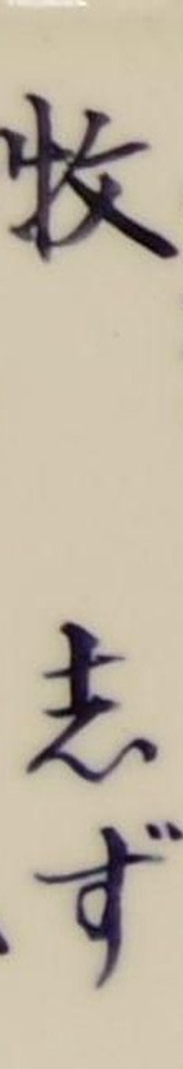牧しず
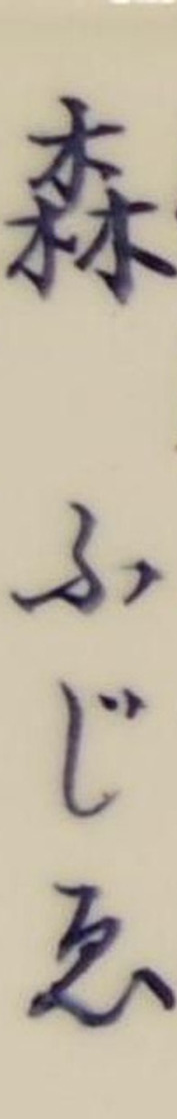森ふじゑ
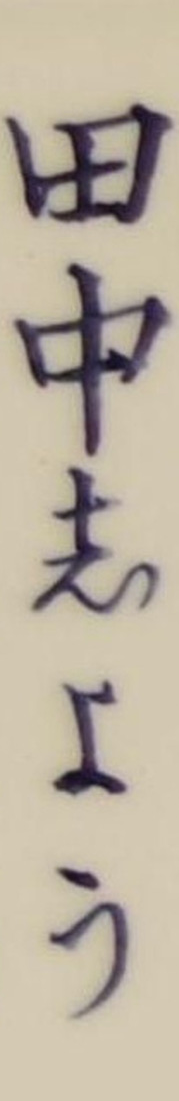田中しよう
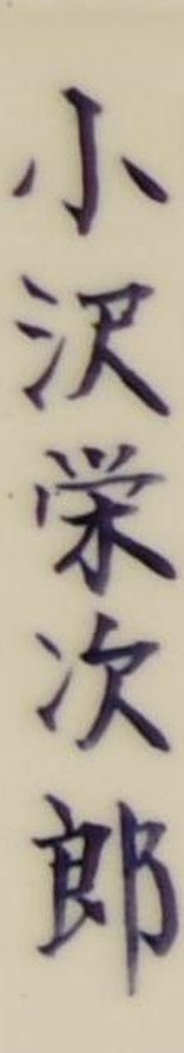小沢栄次郎

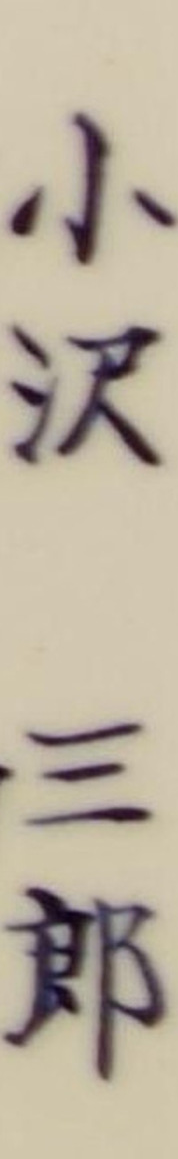小沢三郎
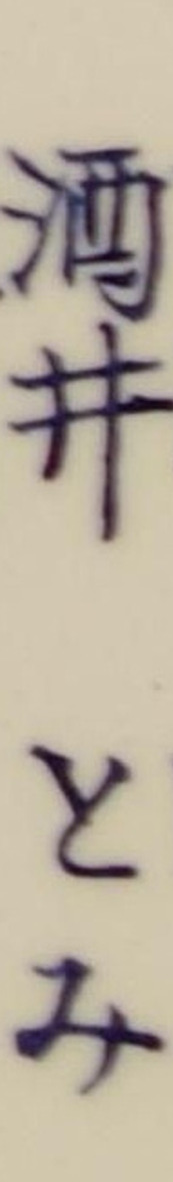酒井とみ
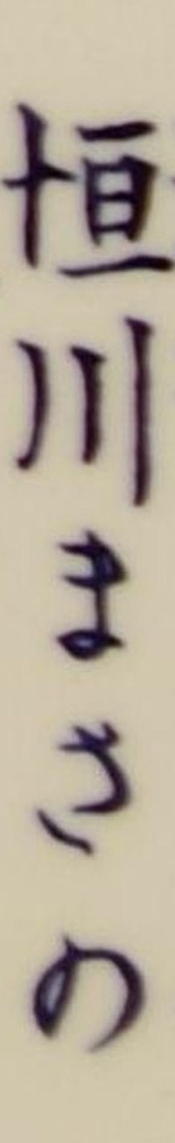恒川まさの
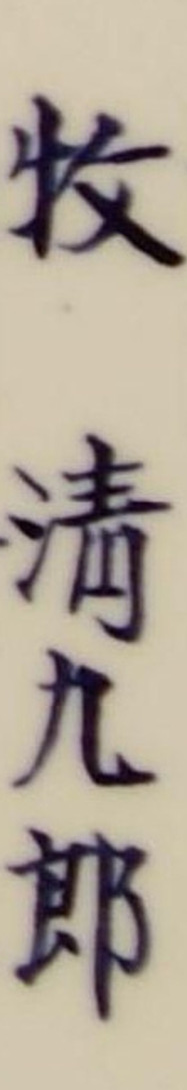牧清九郎
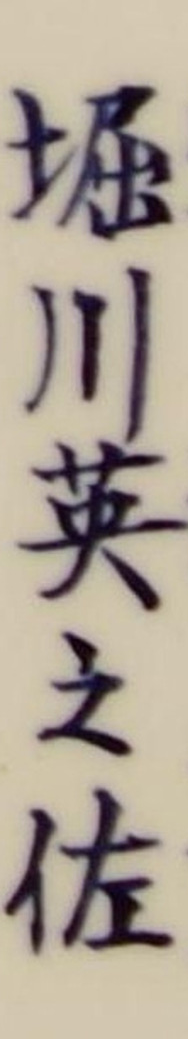堀川英之佐
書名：E~L
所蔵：高野山金剛峯寺
